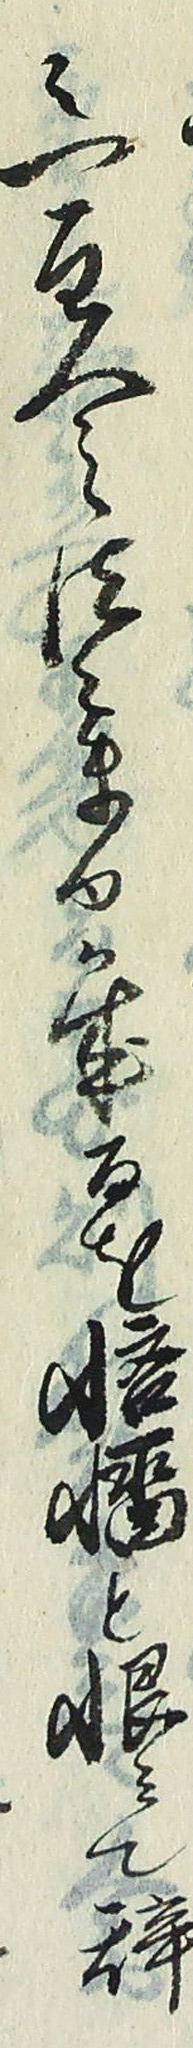々一主人之法こまやか成るを悋懎と恨ミて辞
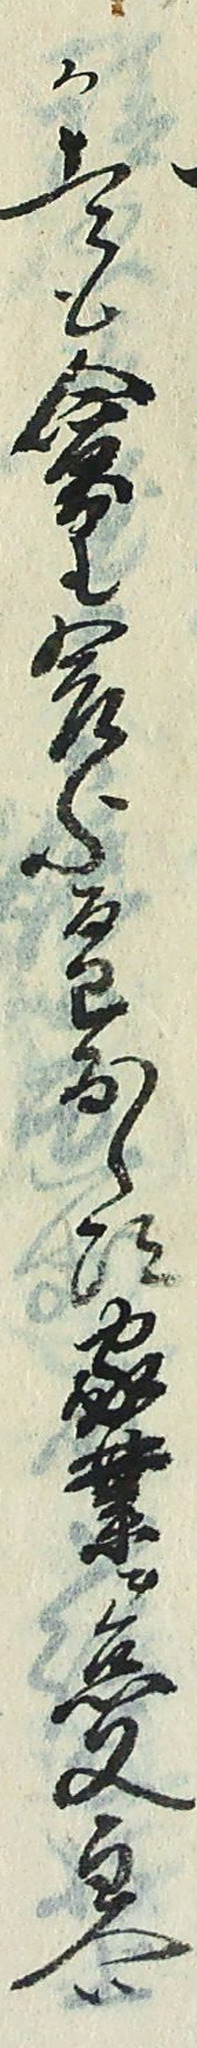か上ニも貪而も食ふ而已ならす家業ヲ怠又主人ハ
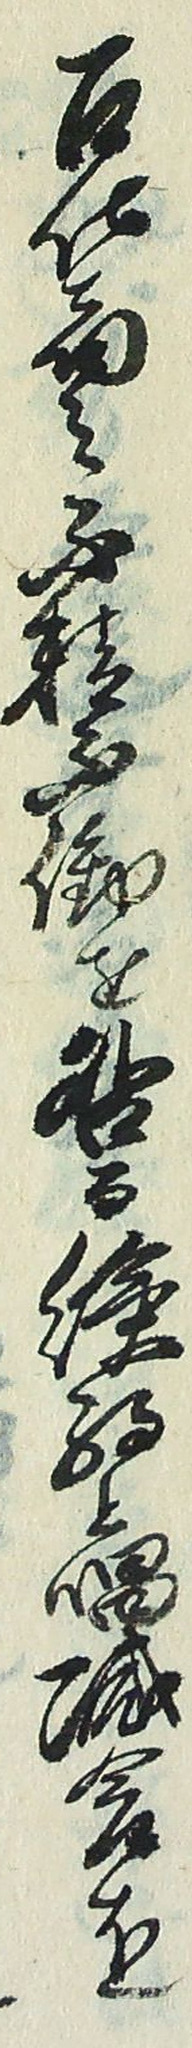召仕者之不精不働を咎而倹約と唱減食を
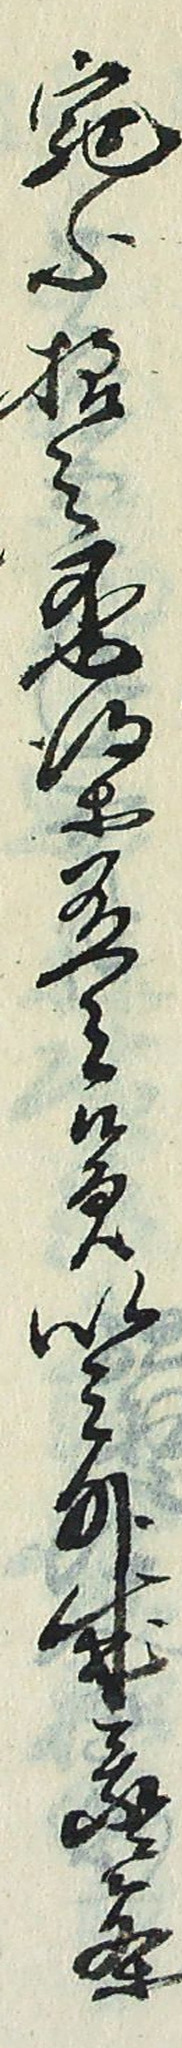宛ふ様之不心得等有之候而ハ以之外成義ニ候条
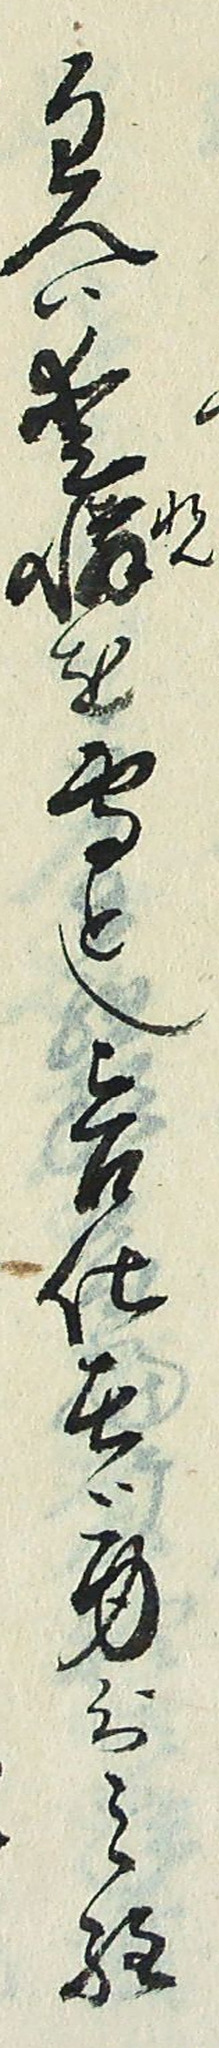主人ハ愛憐を専とし被召仕者ハ身分之程
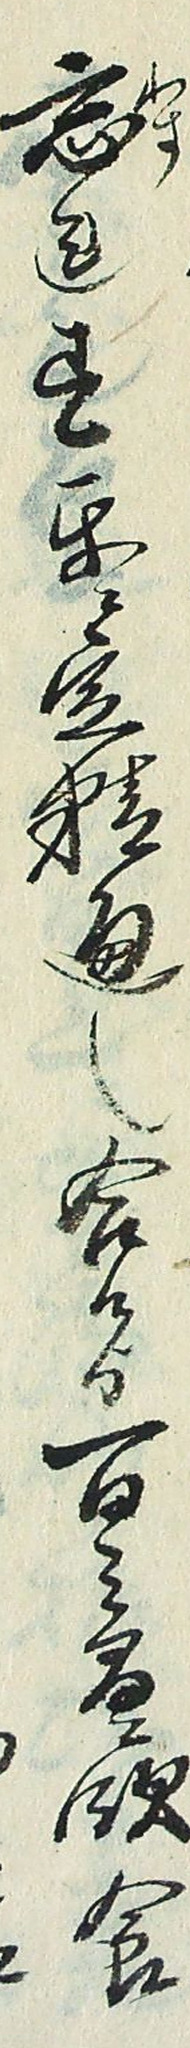忘れす互ニ宜精通し合候ゟ一日之間ニ飲食
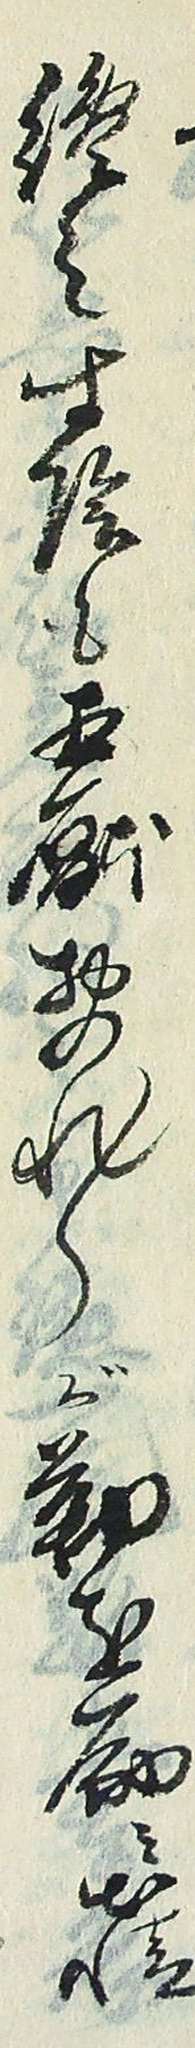纔之寸陰も相厭おのれ〳〵が勤を励ミ出精
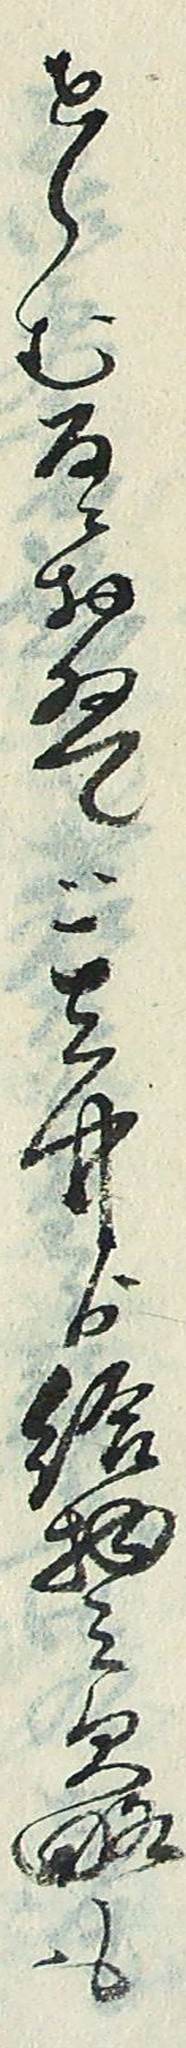せしむるニおゐてハ其中ゟ給物之欠略も

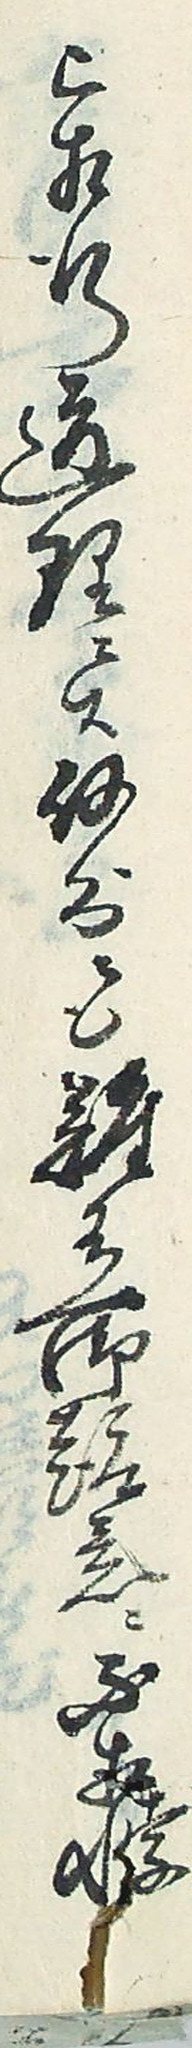被相行道理ニ候何分ニも難有御趣意ニ不相悖
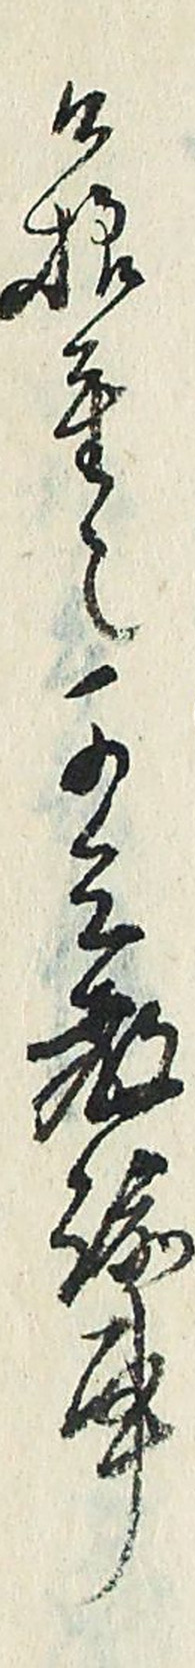候様重々可有教諭事
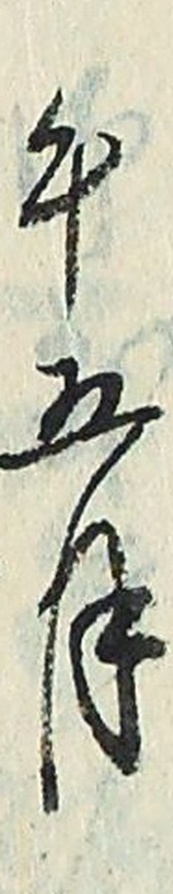午五月
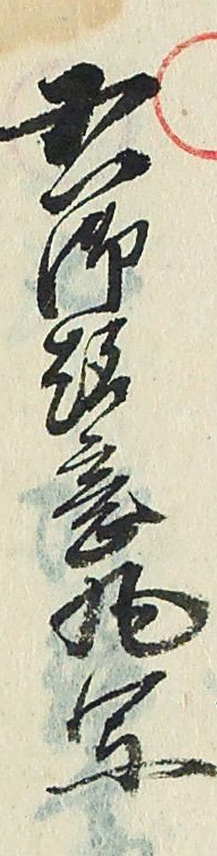右御趣意丸写
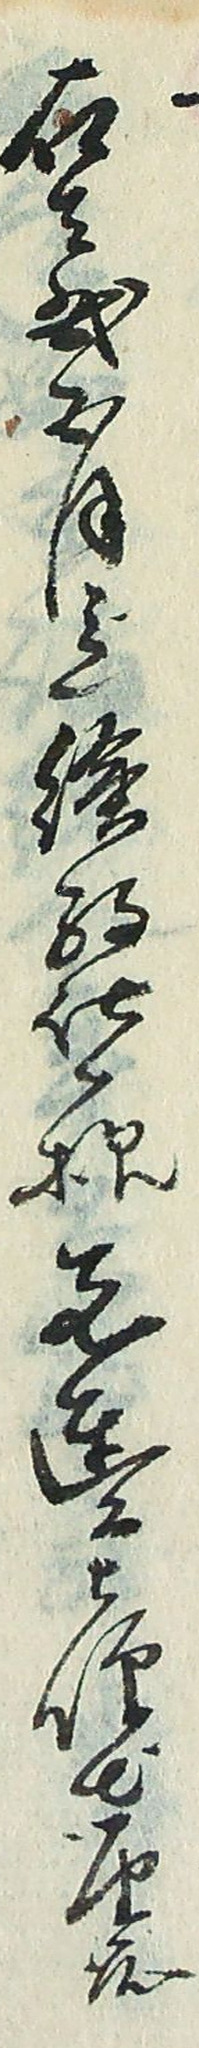右者當五月迄倹約仕候様先達而被仰出御坐候所
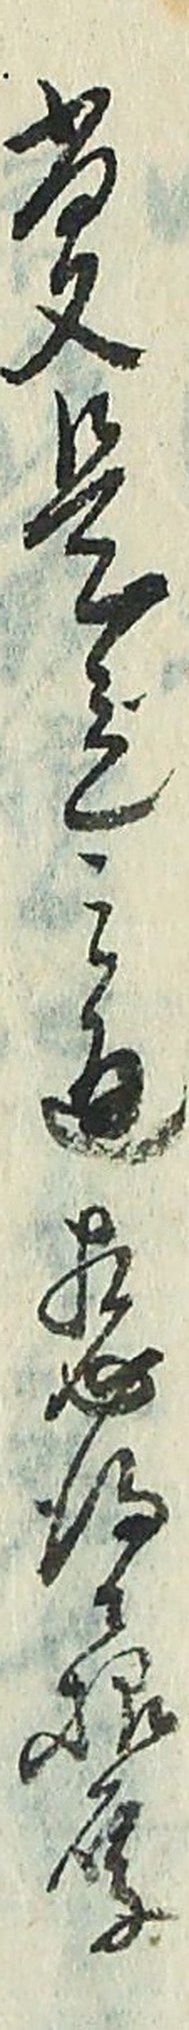尚又是迄之通相心得候様厚
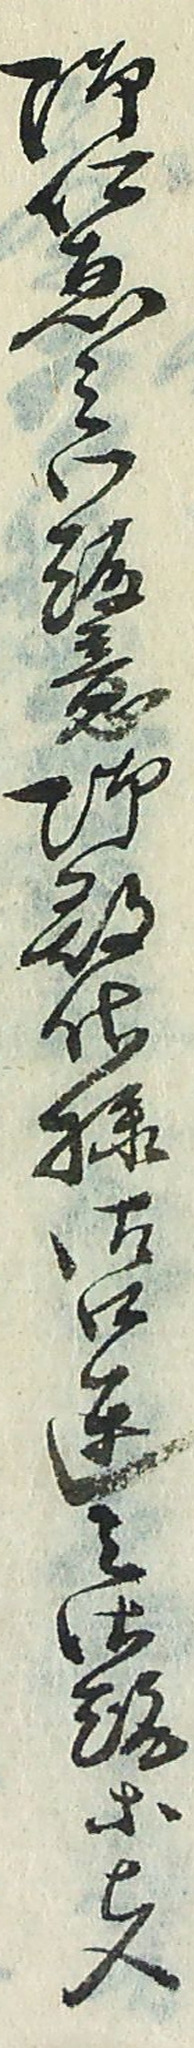御仁恵之御趣意御郡代様御口達之御趣等被入
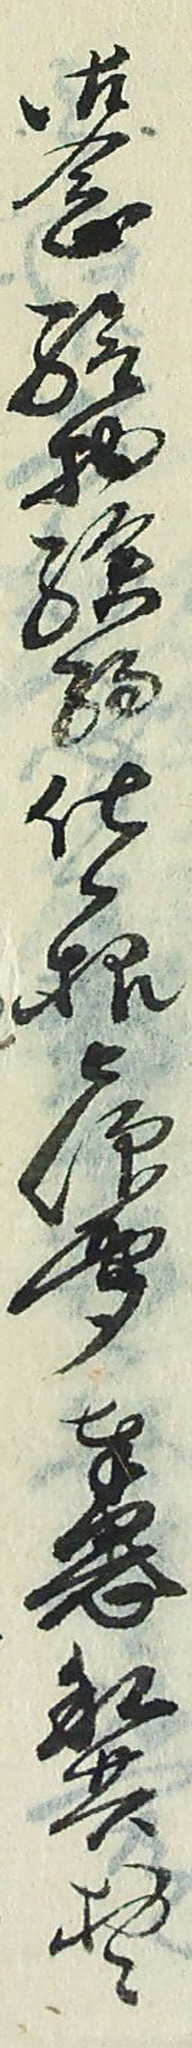御念給物倹約仕候様被仰聞奉畏私共村々
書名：諸御趣意書并御下知向之写
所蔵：鳴門教育大学 Naruto University of Education
